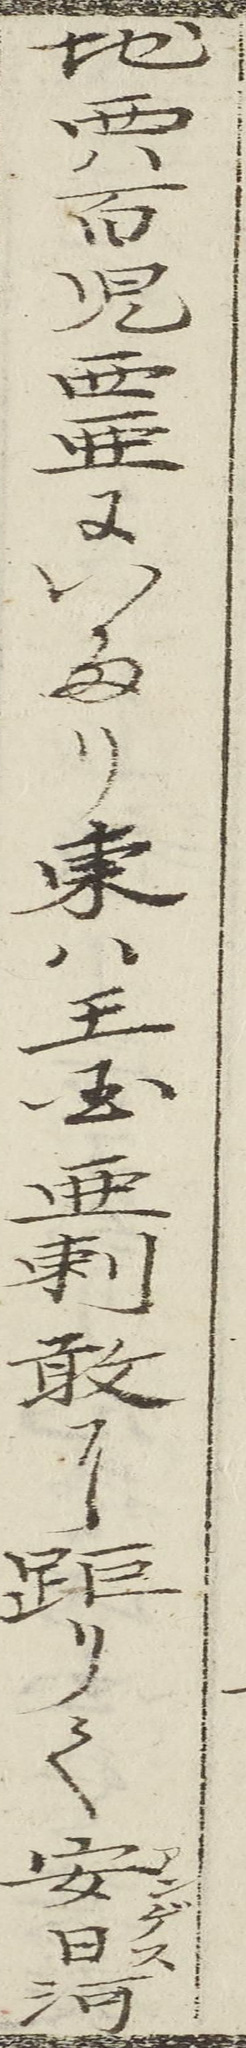地西ハ百児西亜にいたり東は王国亜刺敢に距りて案日河
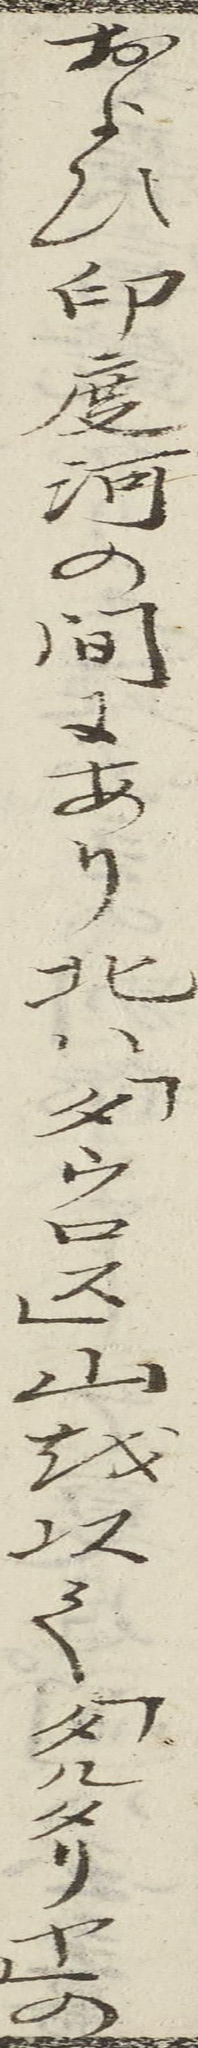およひ印度河の間にあり北ハ「タウロス」山を以て「タルタリヤ」の
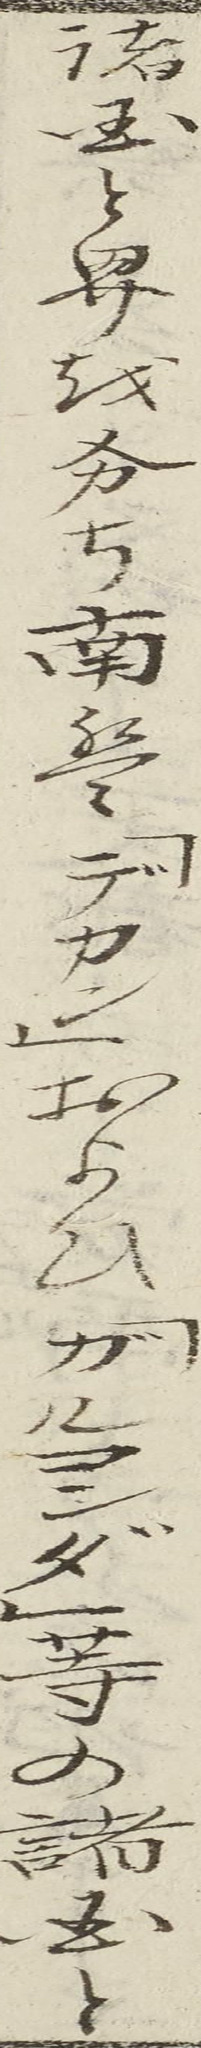諸国と界を分ち南は「テカン」およひ「ガルコンダ」等の諸国と
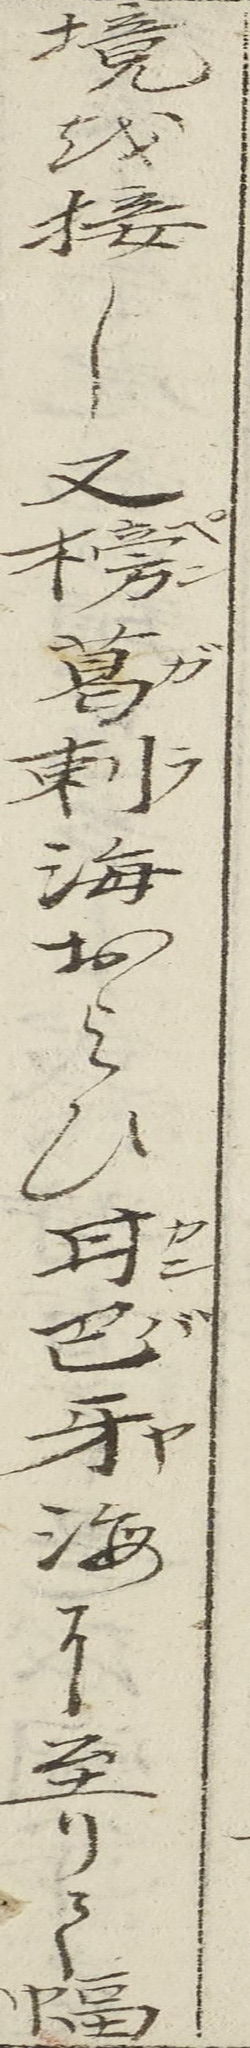境を接し又榜葛刺海およひ甘巴牙海に至りて幅
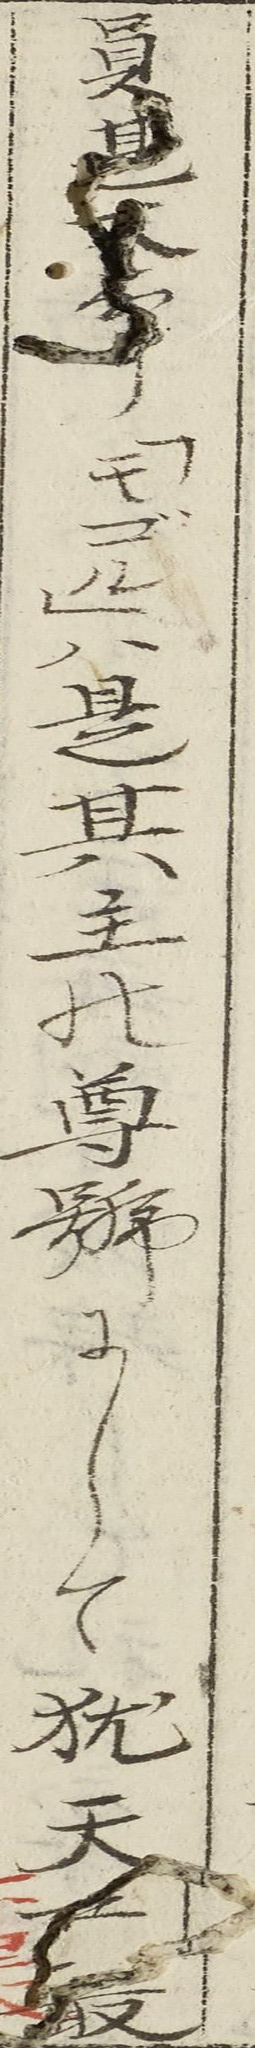員甚大なり「モゴル」は是其主の尊号にして猶天下最
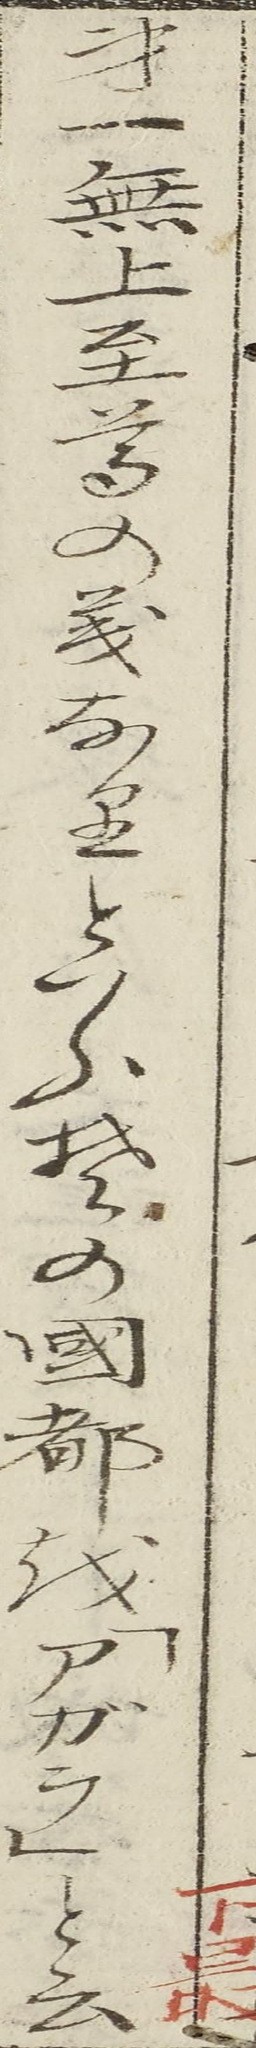第一無上至尊の義なりといふその国都を「アガラ」と云
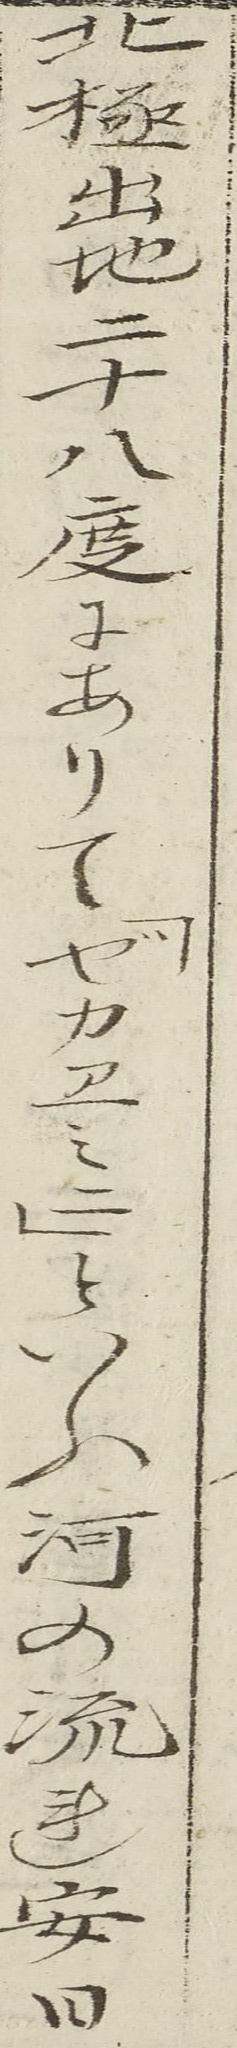北極出地二十八度にありて「ゼカエミ二」といふ河の流れ安日
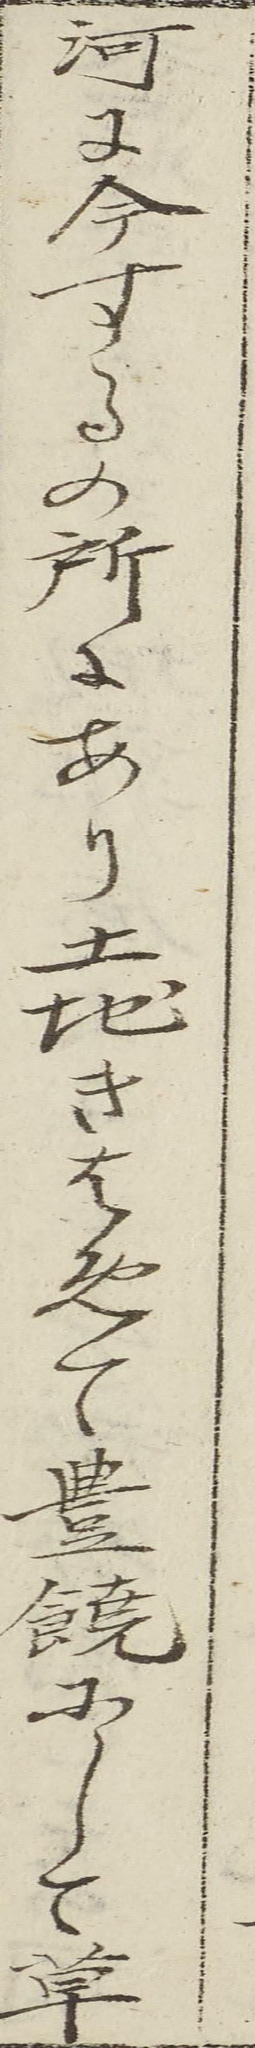河に合するの所二あり土地きはめて豊饒にして草

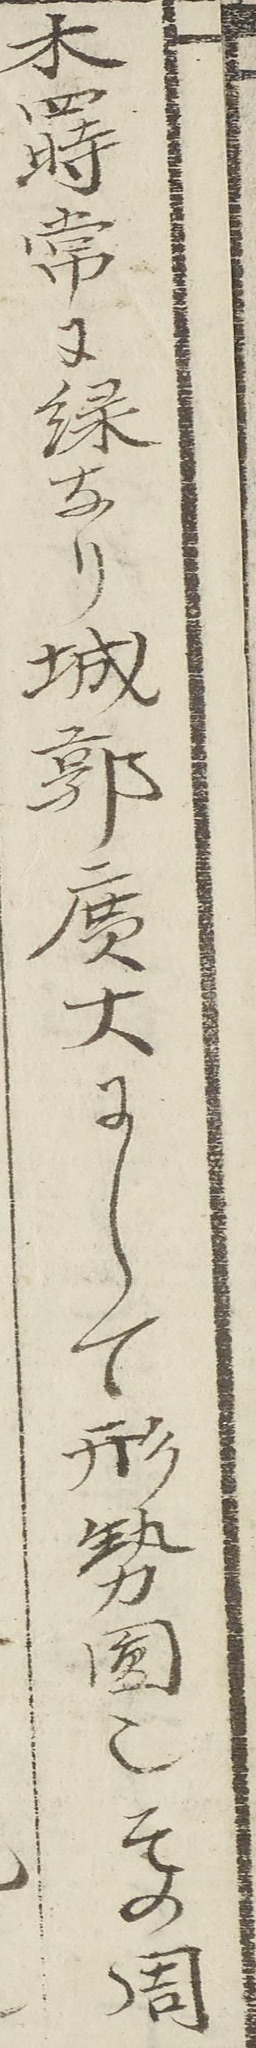木四時常に緑なり城郭広大にして形勢円也其周
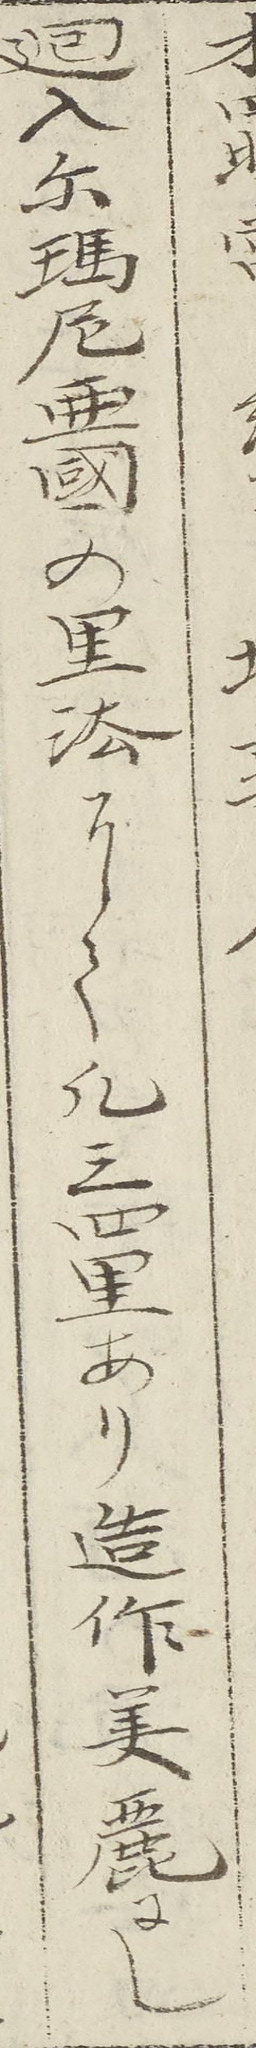周廻入尓瑪尼亜の里法にて凡三四里あり造作美麗にし
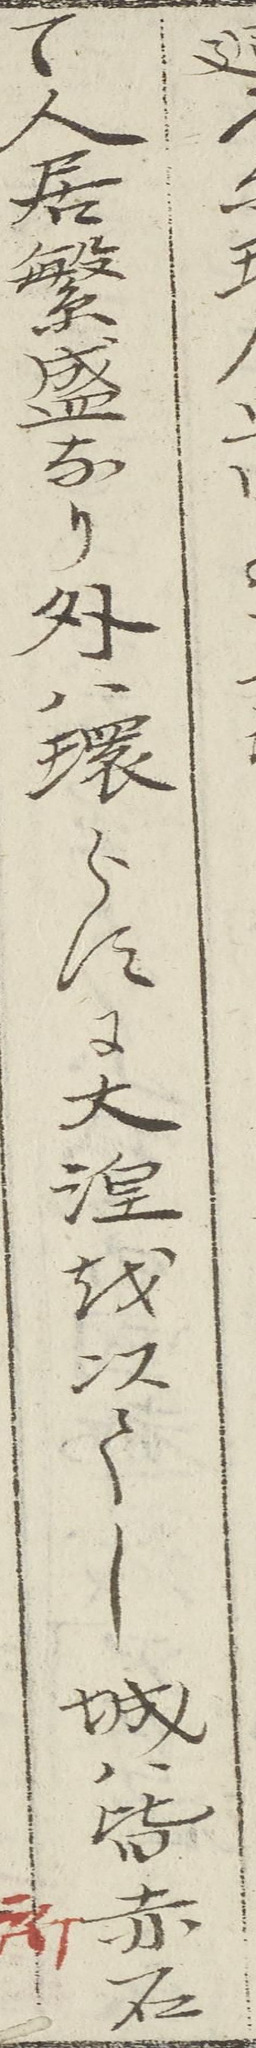て人居盛なり外ハ環らすに大湟を以てし城ハ皆赤石
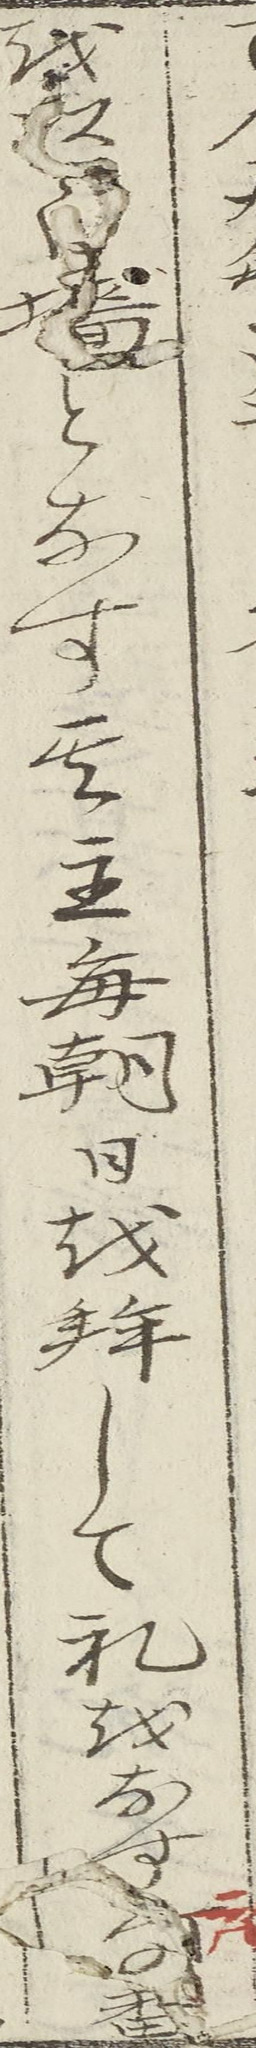を以て檣となす其主毎朝日を拝して礼をなす所の番
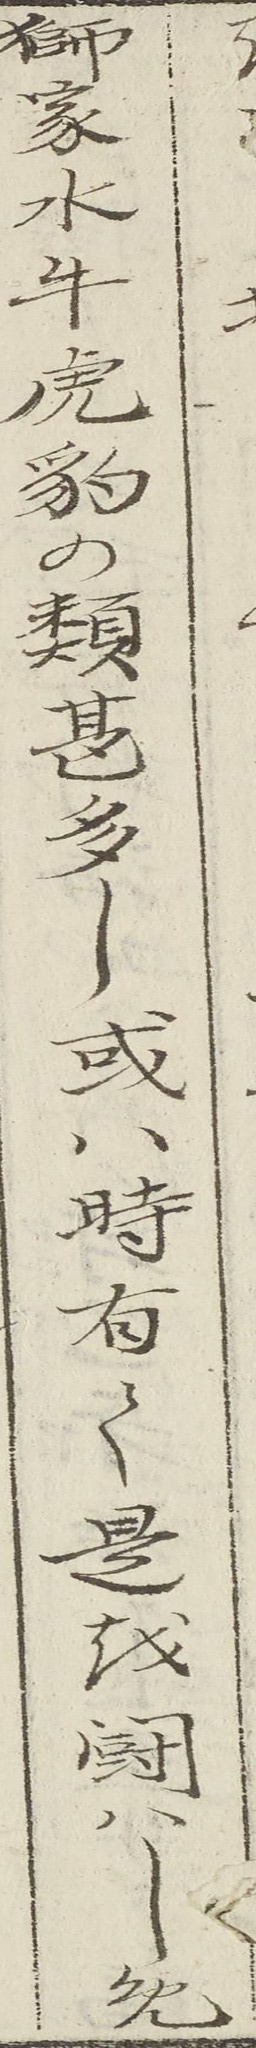獅家水牛虎豹の類甚多し或ハ時有て是を闘ハしめ
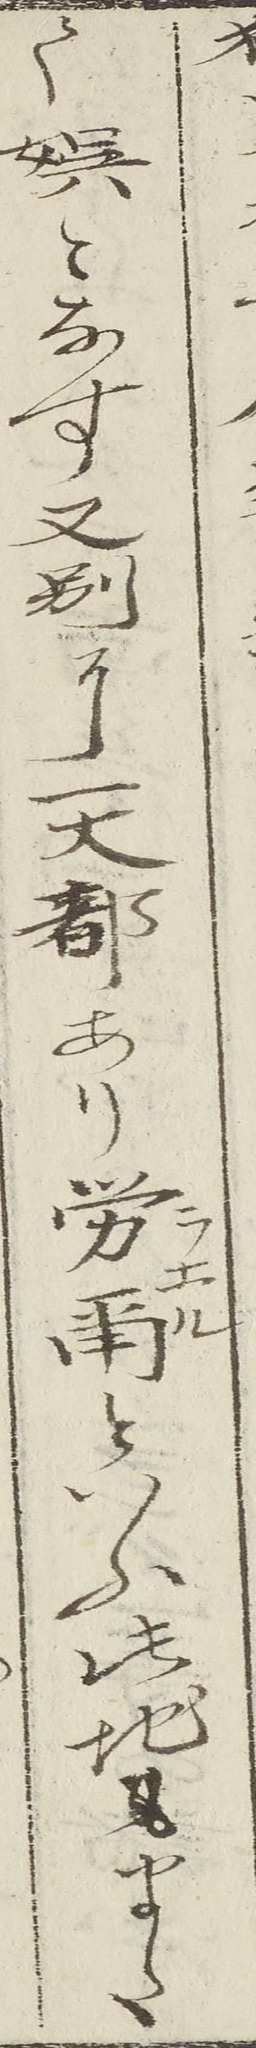て娯となす又別に一大都あり労甫といふ此地もまた
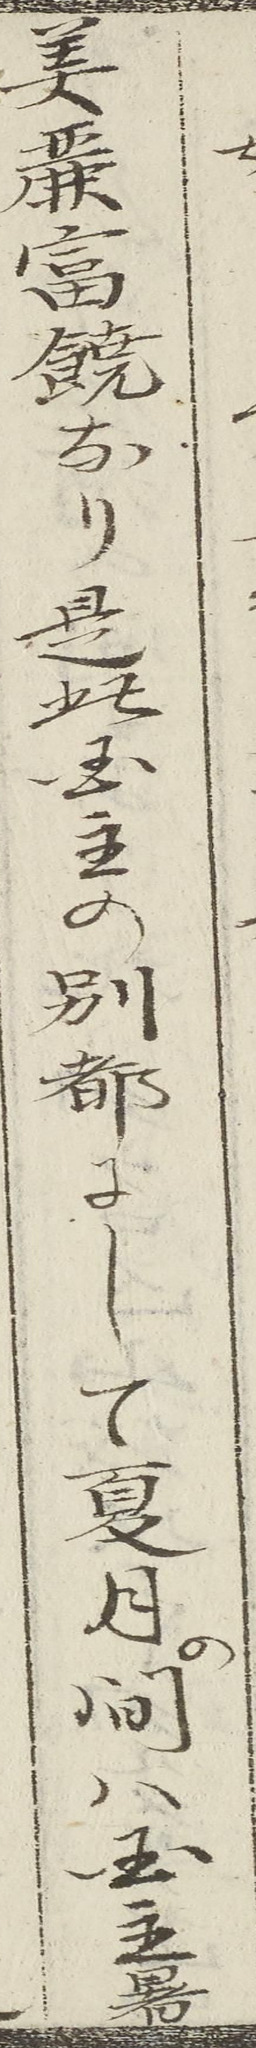美麗冨饒なり是此国主の別都にして夏月の間ハ国主暑
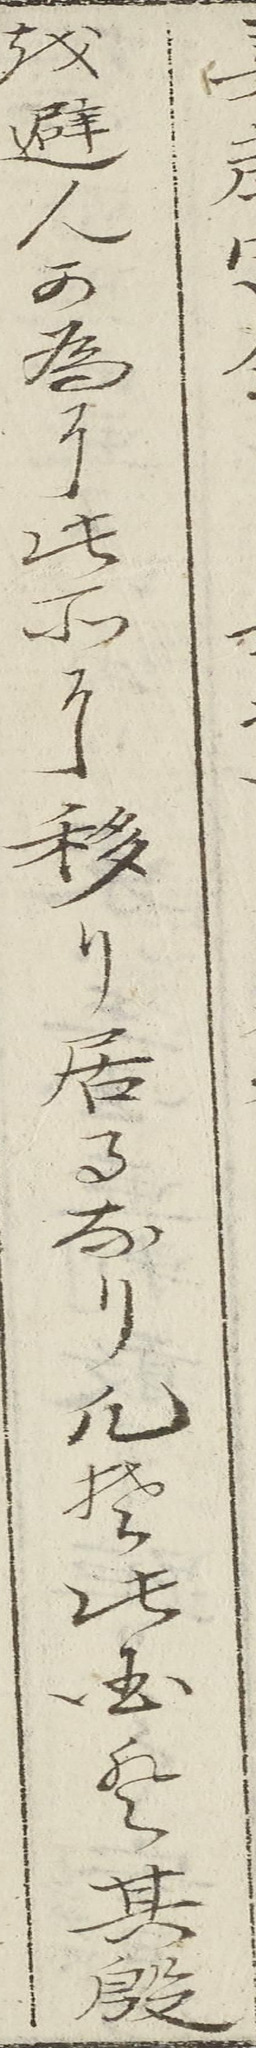を避んか為に此所に移り居るなり凡そ此国は其殷
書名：西洋雜記　坤
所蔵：東京大学地震研究所図書室 Earthquake Research Institute Library, The University of Tokyo, JAPAN
